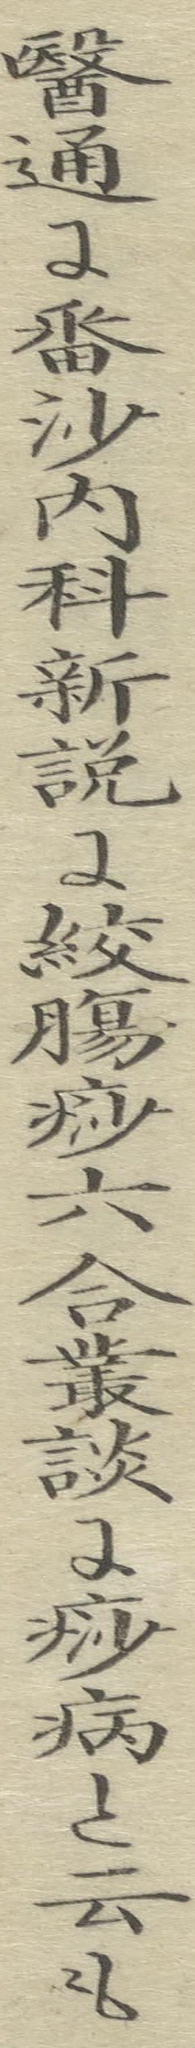醫通に番沙内科新説に絞膓痧六合叢談に痧病と云も
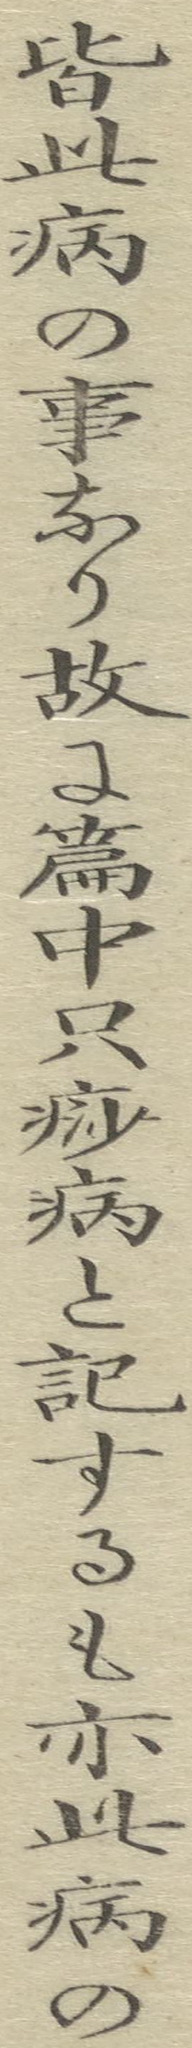皆此病の事なり故に篇中只痧病と記するも亦此病の
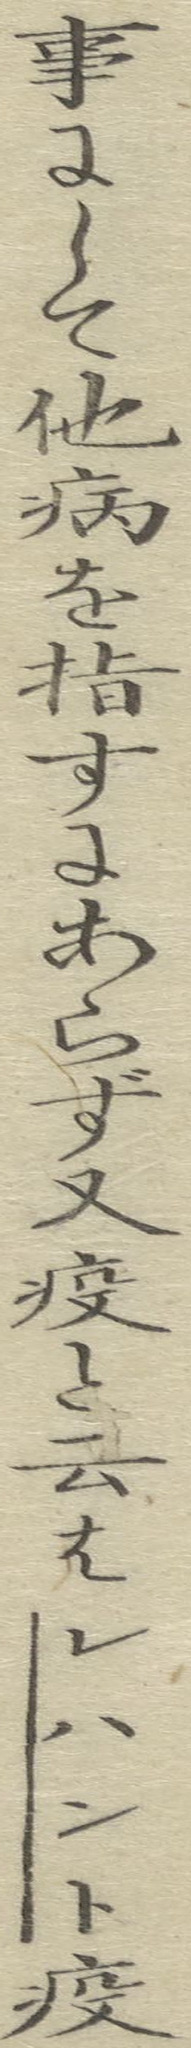事にして他病を指すにあらず又疫と云はレハント疫
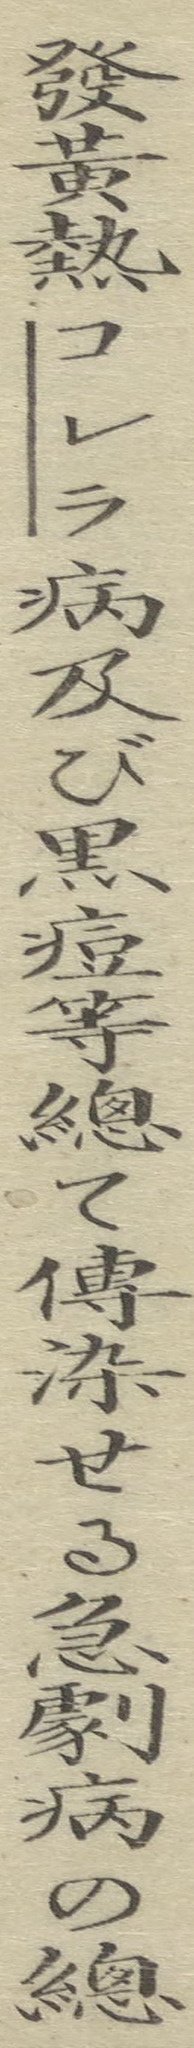發黄熱コレラ病及び黒痘等総て傅染せる急劇病の総
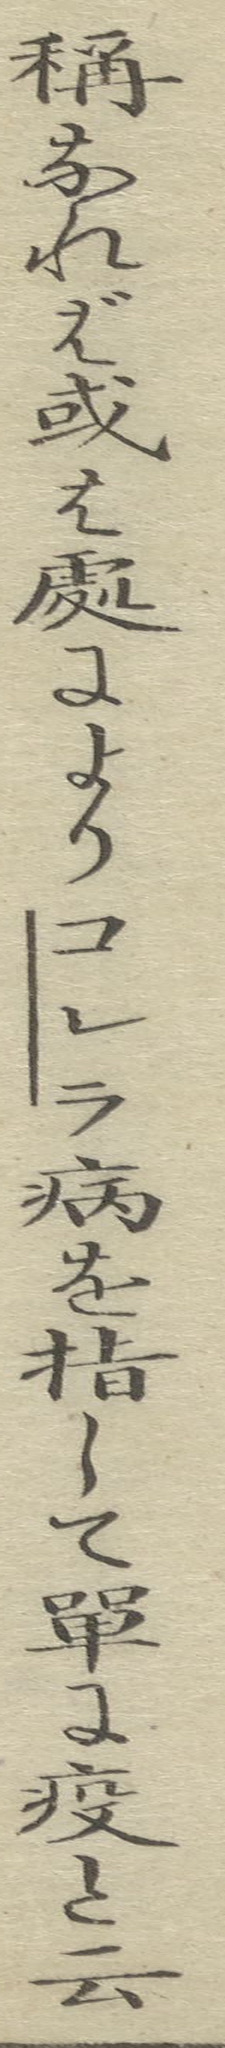稱なれば或は處によりコレラ病を指して単に疫と云
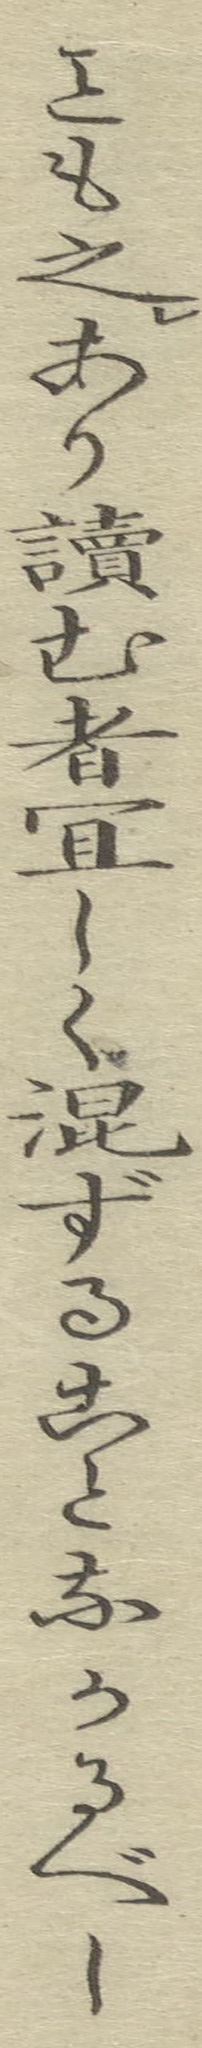ことも之讀む者宜しく混ずることなかるべし
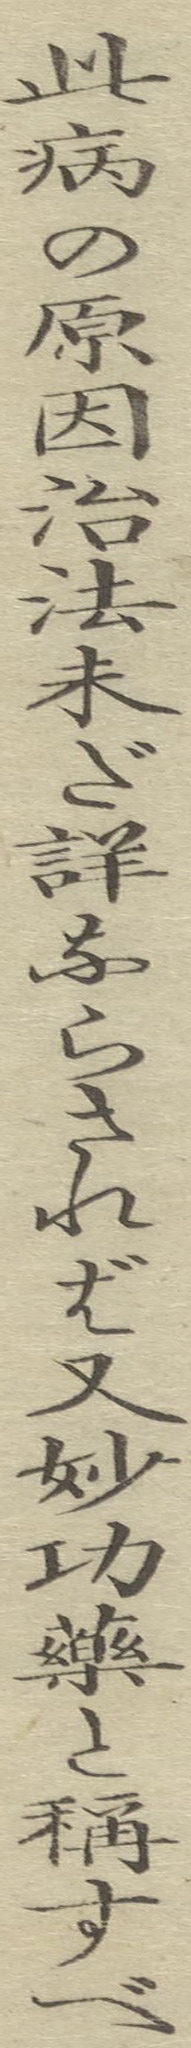此病の原因治法未だ詳ならされば又妙効藥と稱すべ
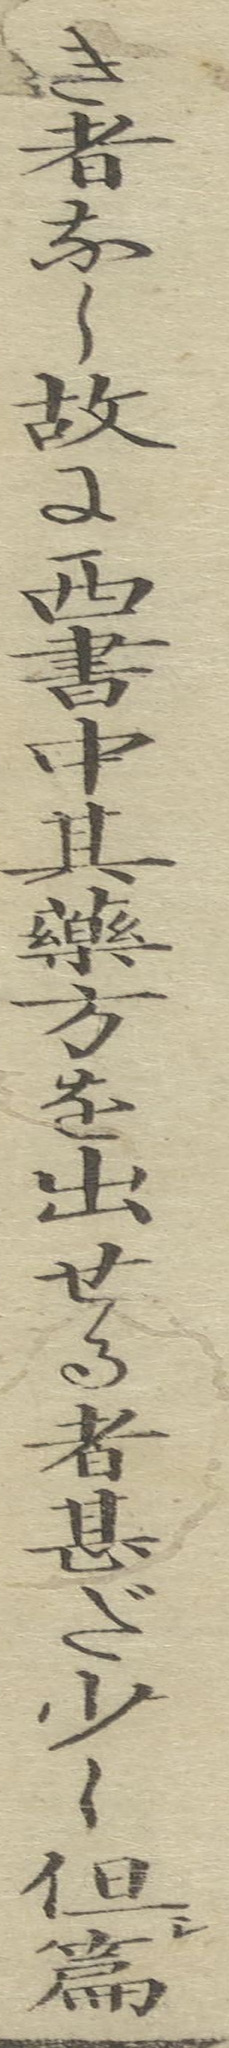き者なし故に西書中其藥方を出せる者甚だ少し但篇

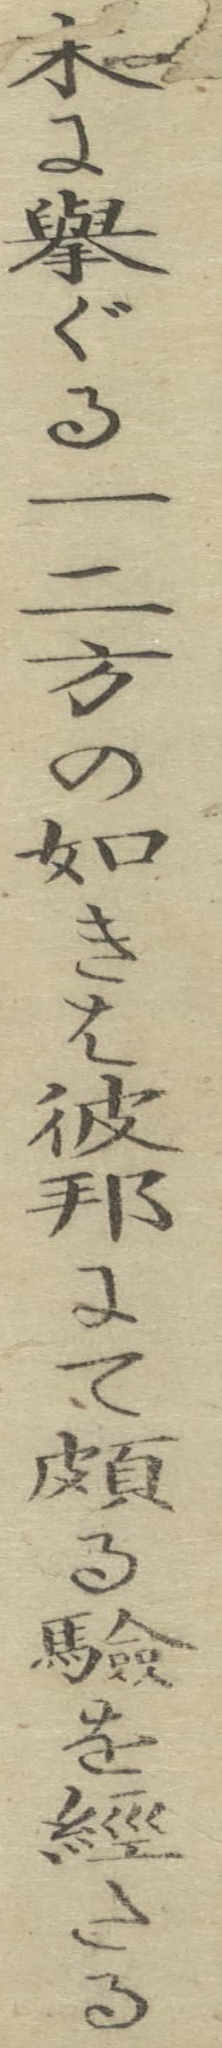末に挙ぐ事一二方の如きは彼邦にて頗る驗を經たる
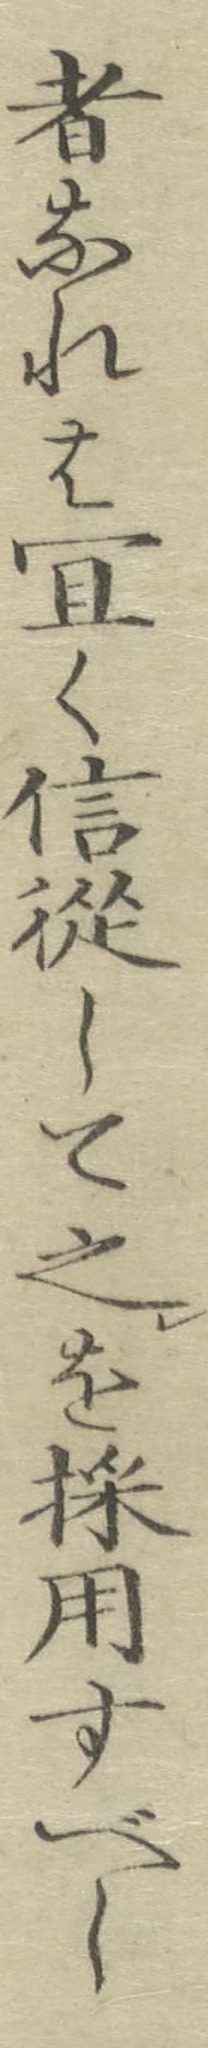者なれは宜く信從して之採用すべし
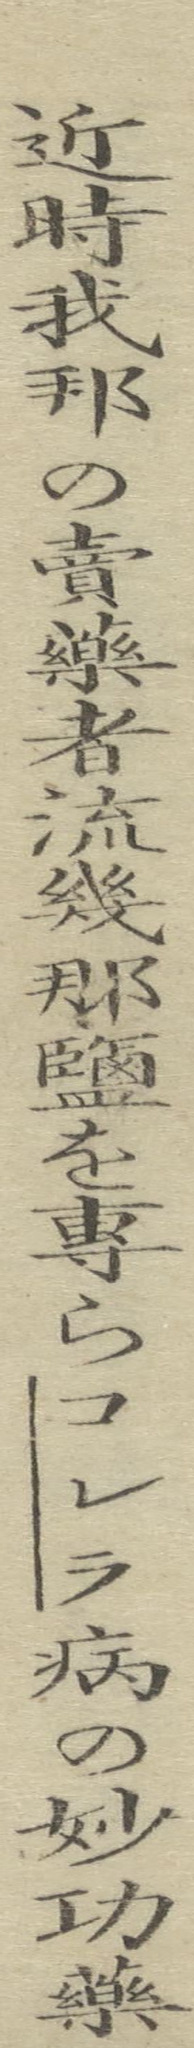一近時我邦の賣藥者流幾群䀋を専らコレラ病の妙功藥
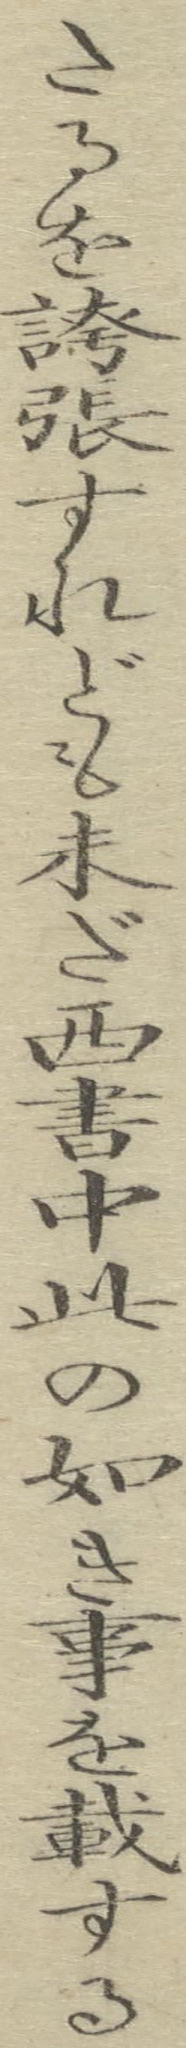たるを誇張すれども未だ西書中此の如き事を載する
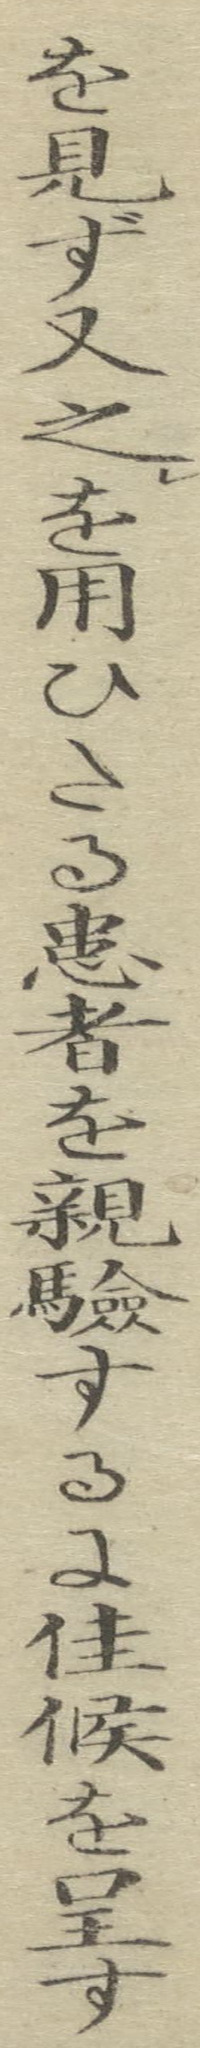を見ず又之用ひたる患者を親驗するに佳候を呈す
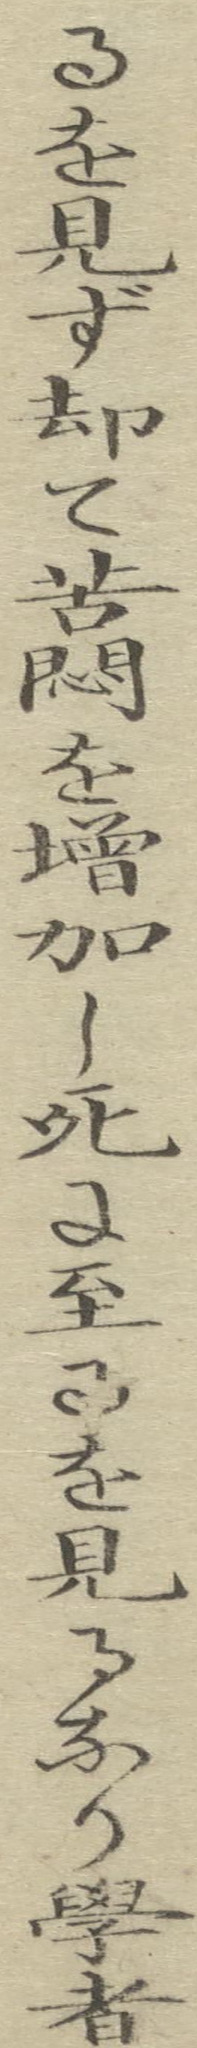るを見ず却て苦悶を増加し死に至るを見るなり學者
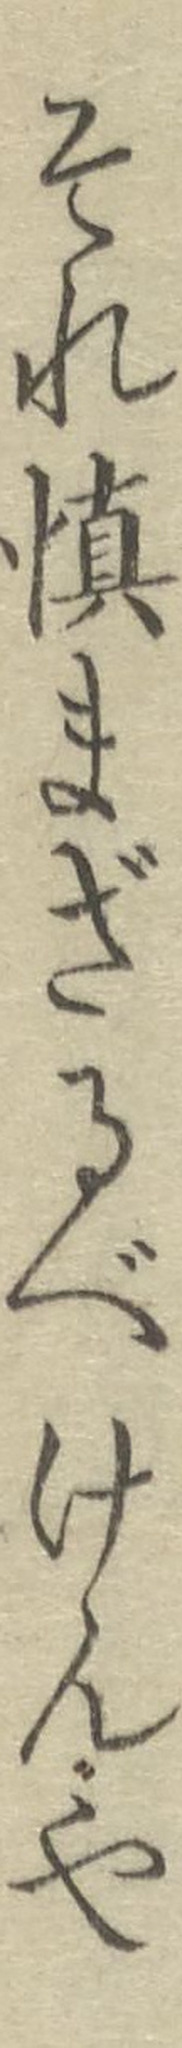それ慎まざるけんや
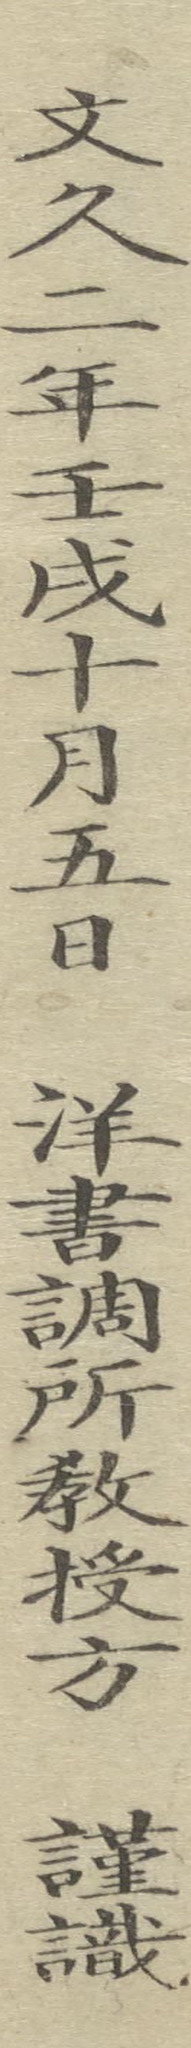文久二年壬戌十月五日洋書調所教授方謹識
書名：官版疫毒預防説　全
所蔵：東京大学総合図書館 General Library in the University of Tokyo, JAPAN
